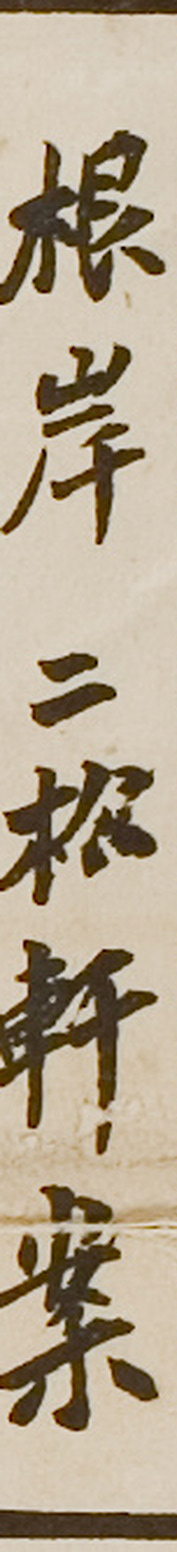根岸二松軒案
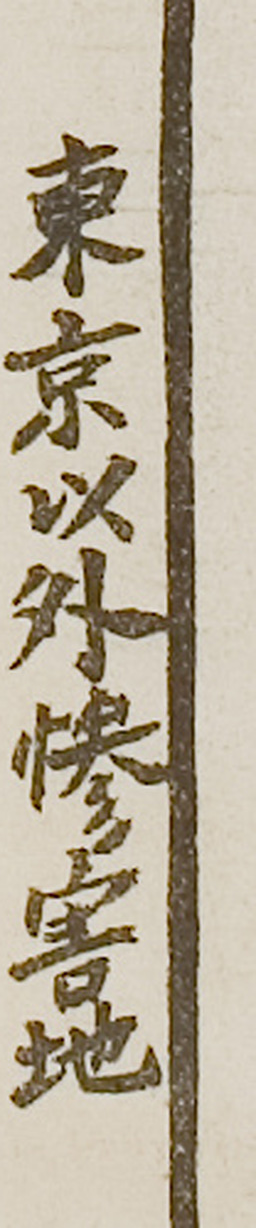東京以外惨害地
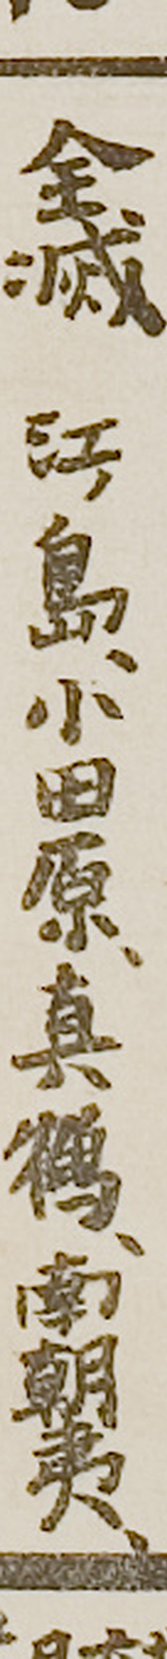全滅江ノ島、小田原、真鶴、南朝夷、
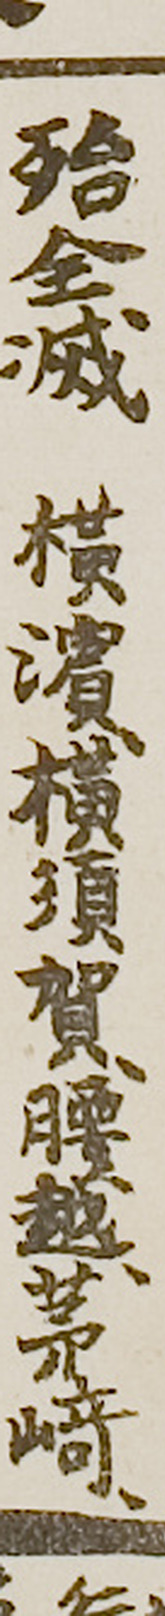殆全滅横浜、横須賀、腰越、茅崎、
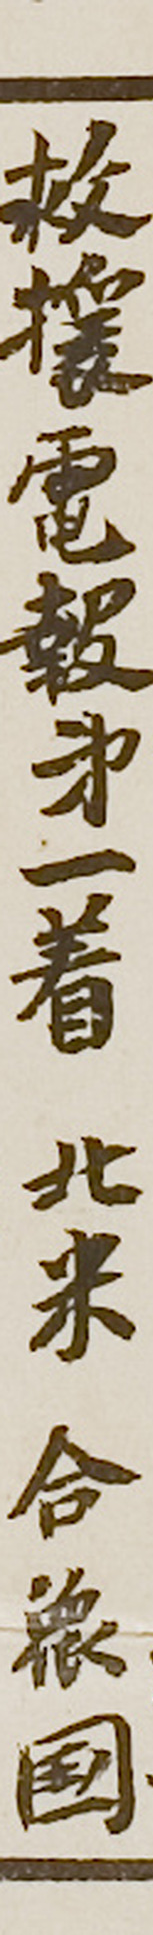救援電報第一着北米合衆国
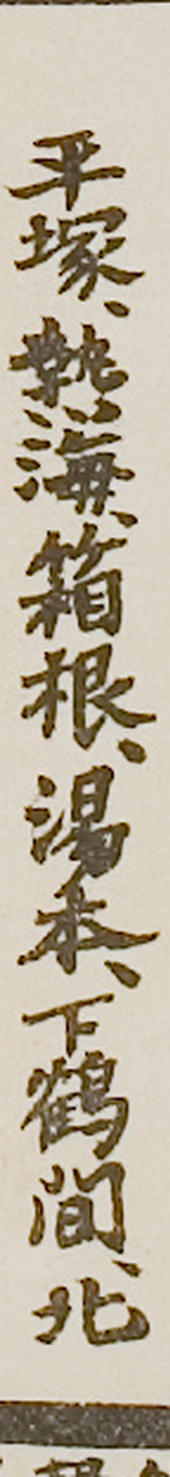平塚、熱海、箱根、湯本、下鶴間、北
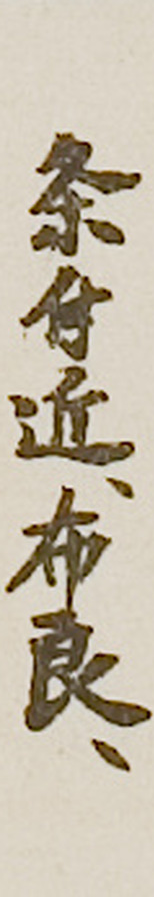条付近、布良、
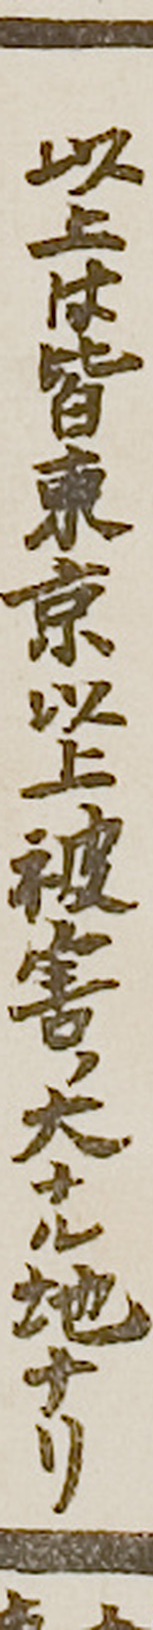以上は皆東京以上被害ノ大ナル地ナリ
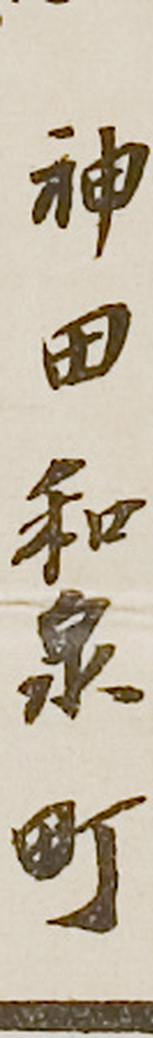神田和泉町
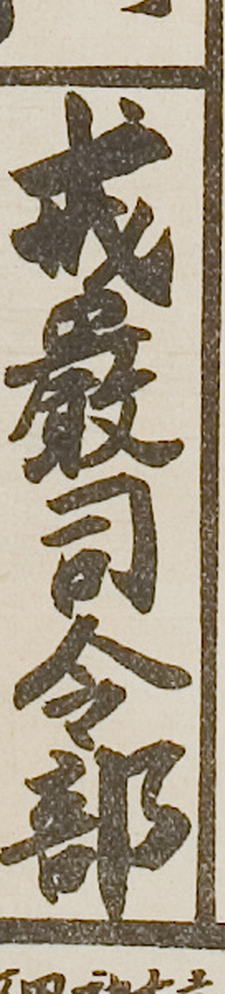戒厳司令部
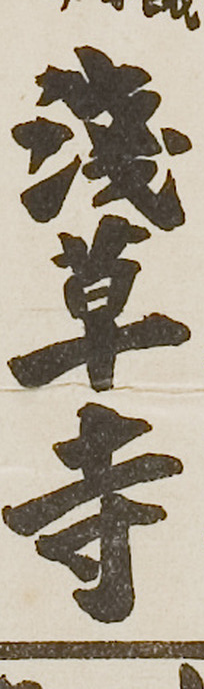浅草寺
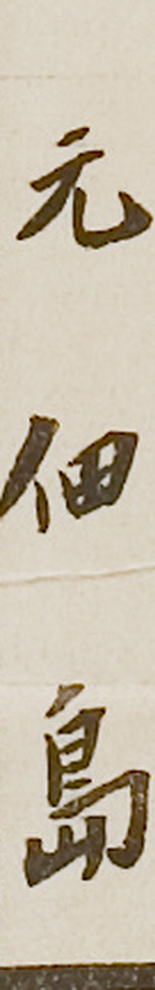元佃島
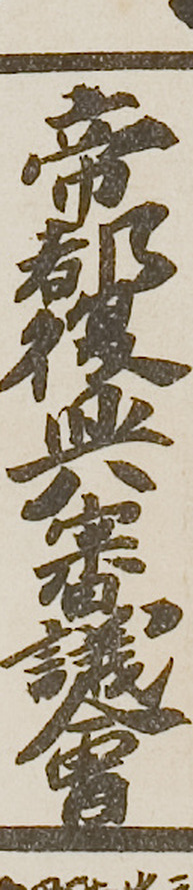帝都復興審議会
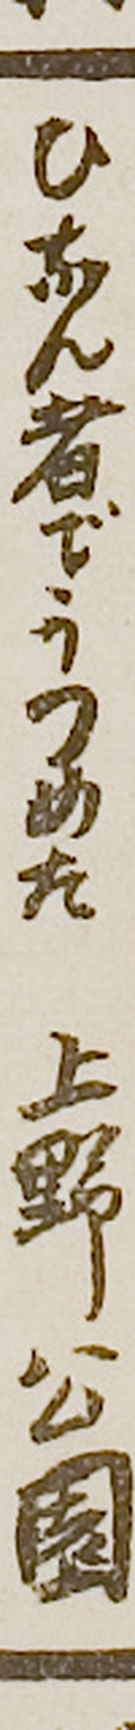ひなん者でうつめた上野公園
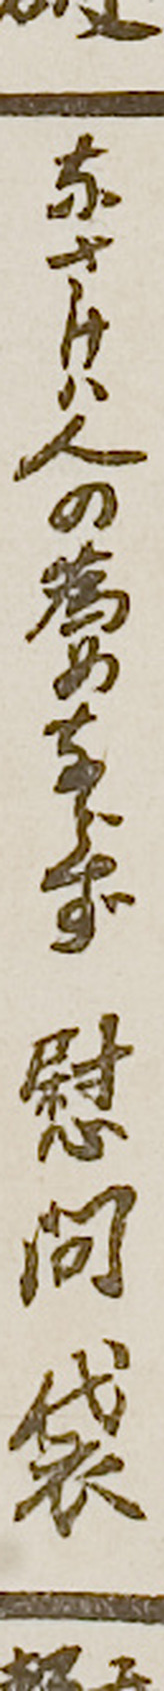なさけは人の為めならず慰問袋
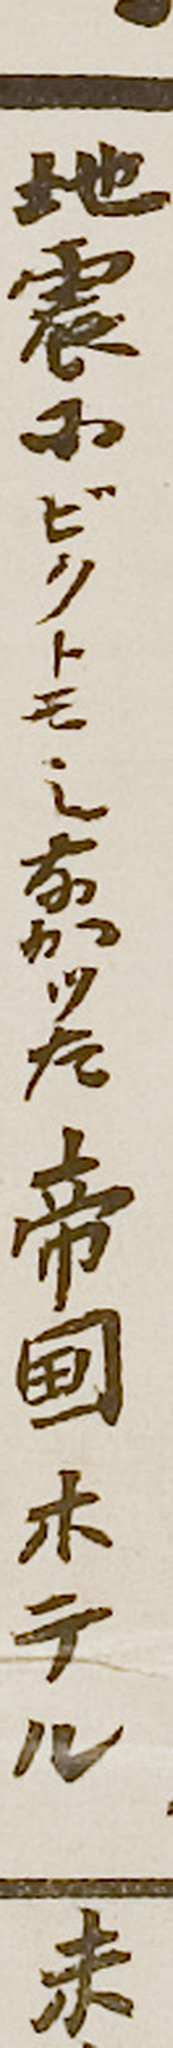地震にビクトモしなかツた帝国ホテル
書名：帝都大震災一覧
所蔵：東京大学総合図書館 General Library in the University of Tokyo, JAPAN
